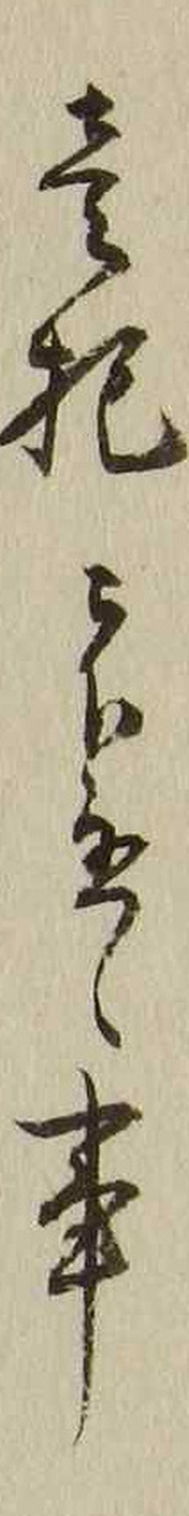壱把被下置候事
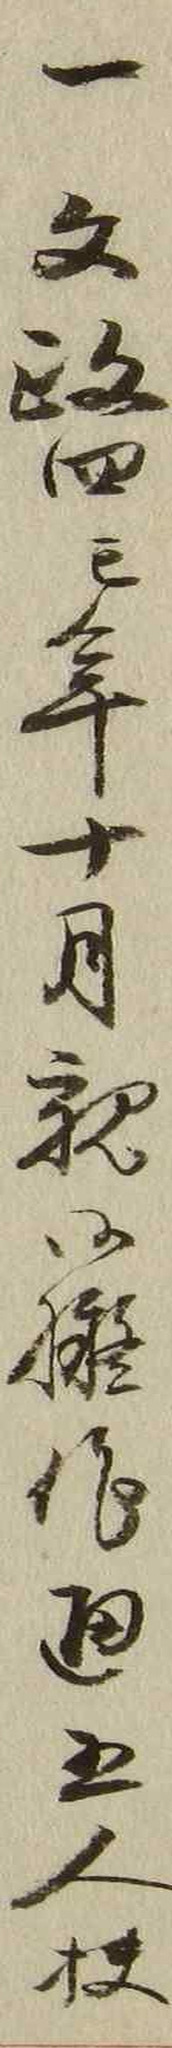一文政四巳年十月親御擬作通五人扶
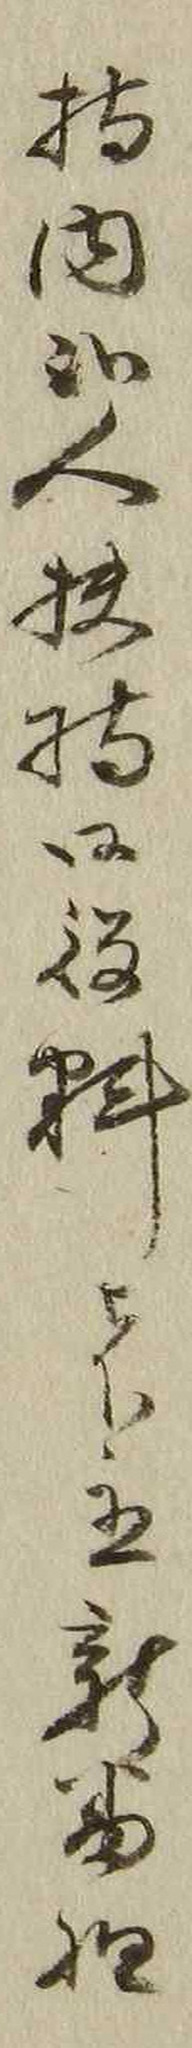持内弐人扶持御役料被下置新番組
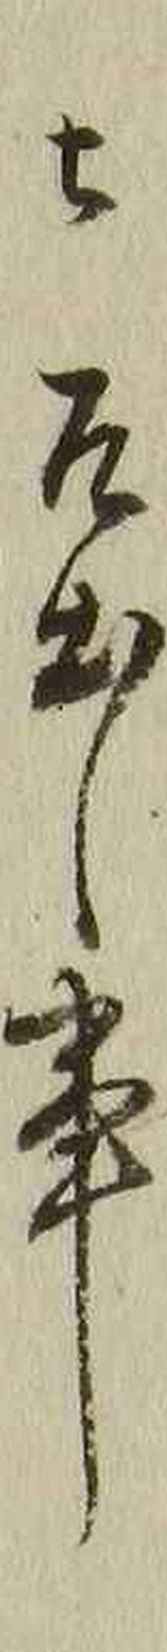被召出候事
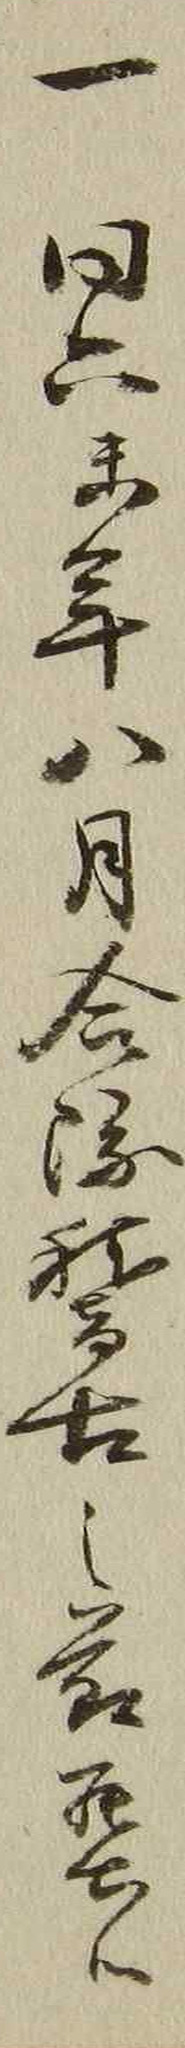一同六未年八月合隊稽古之節罷出候
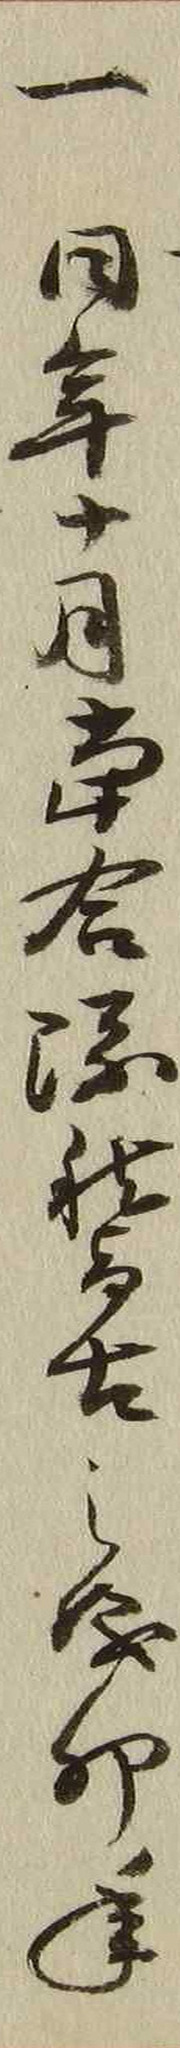一同年十月当合隊稽古之儀卯年
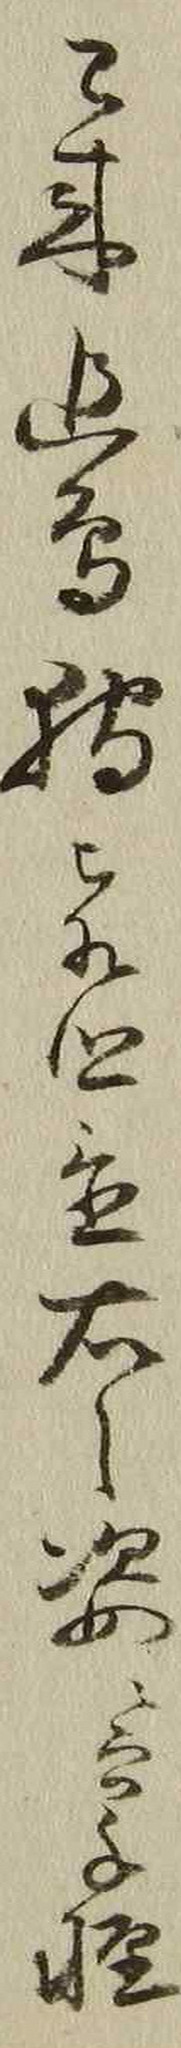已来追鳥狩被相止置右之姿ニ而手軽
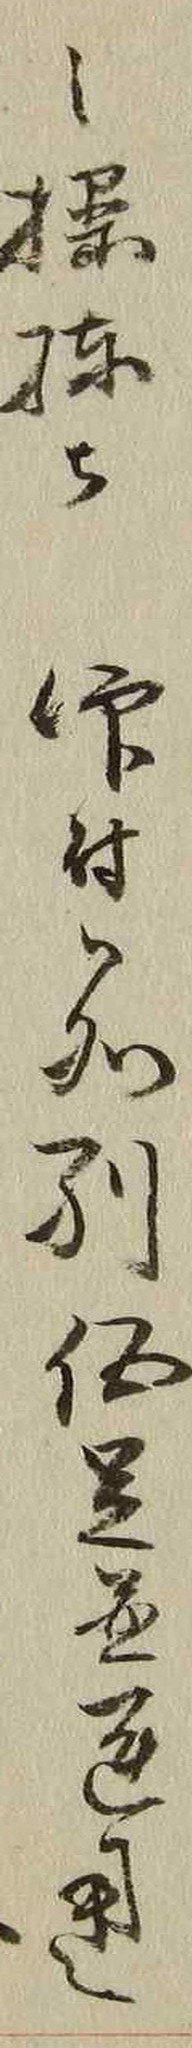之操練被仰付候処列伍足並運用之
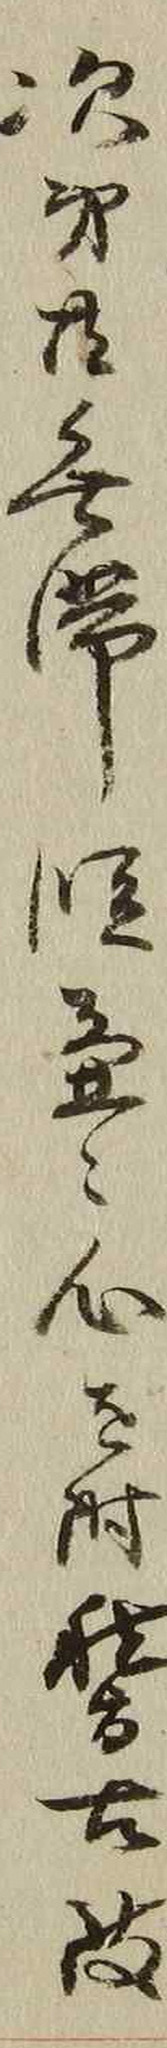次第共無滞段兼々心を附稽古致
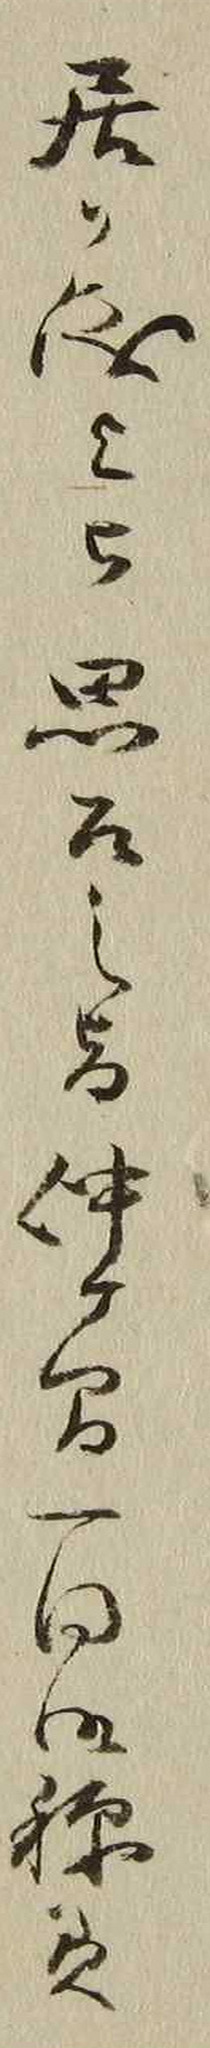居候儀と被思召之旨仲ヶ間一同御称美
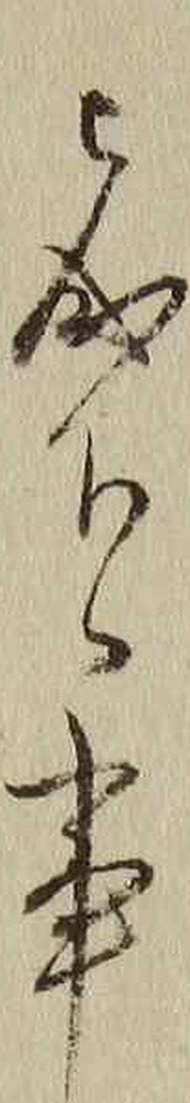被成下候事
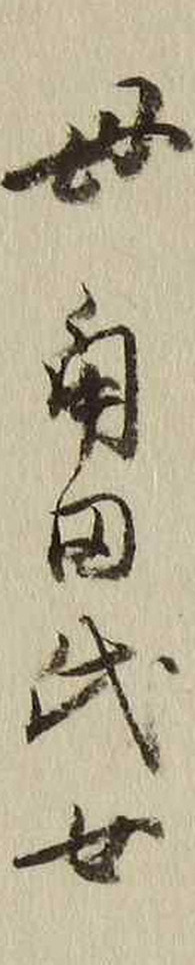母角田氏女
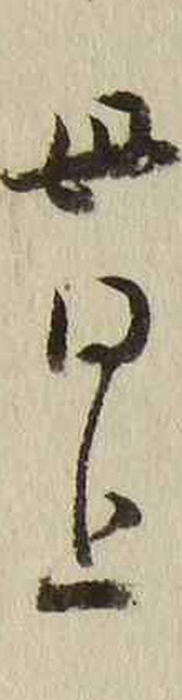母同上

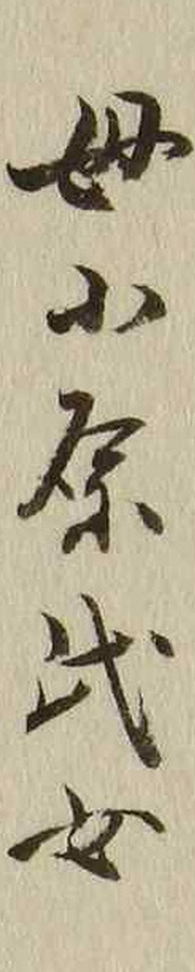母小原氏女
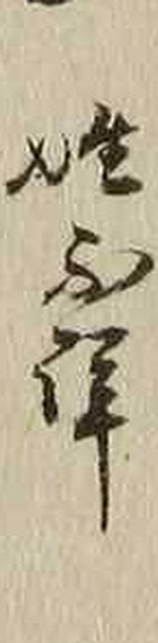母不詳
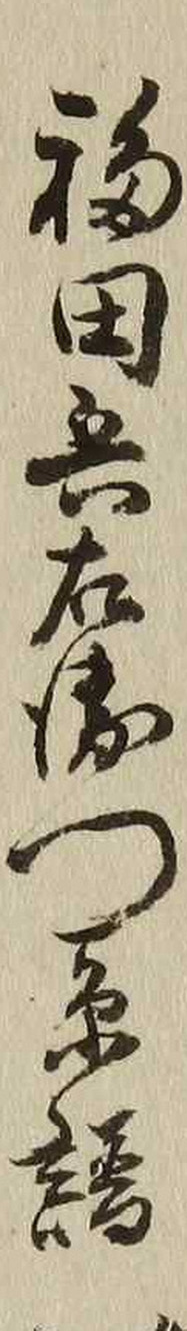福田兵左衛門利房
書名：諸士系譜　巻之236　ふ之部4
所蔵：会津若松市立会津図書館
